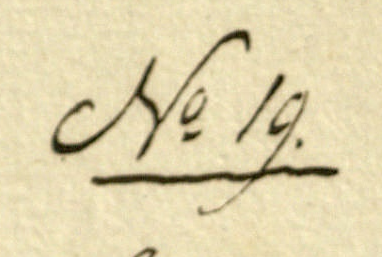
No 19.
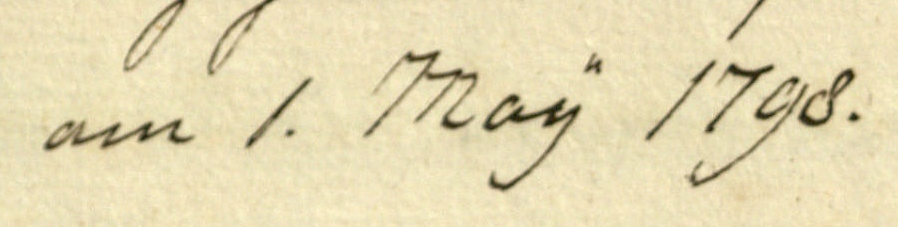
am 1. Maÿ 1798.
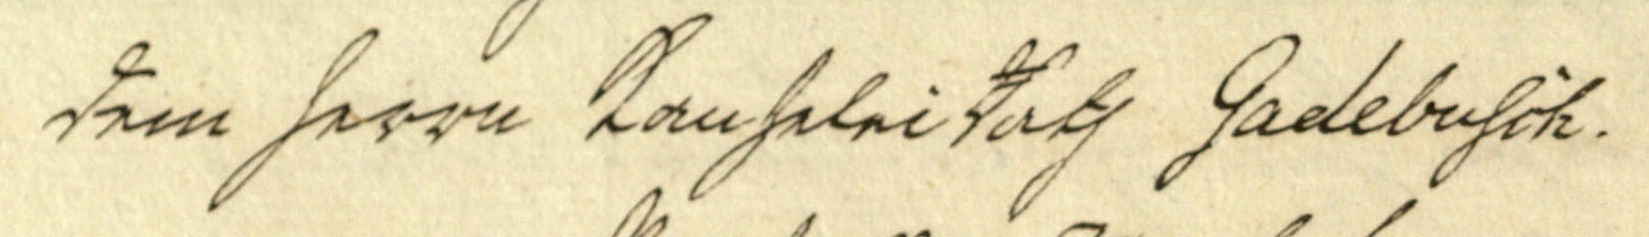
dem Herrn Kanzelei Rath Gadebusch.
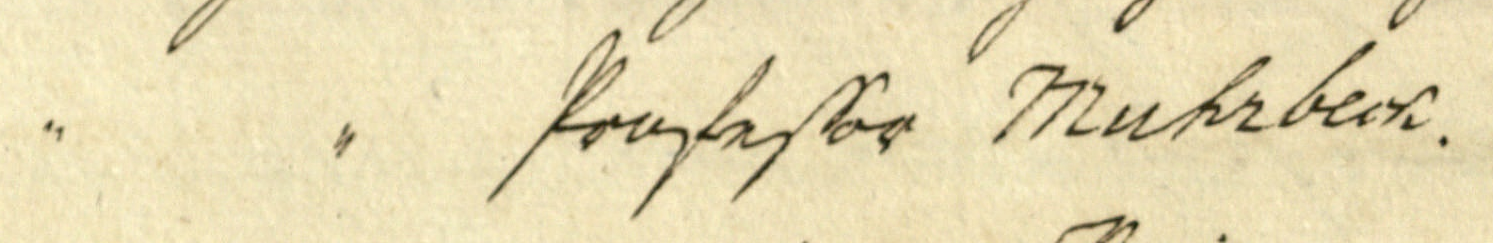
Professor Muhrbeck.
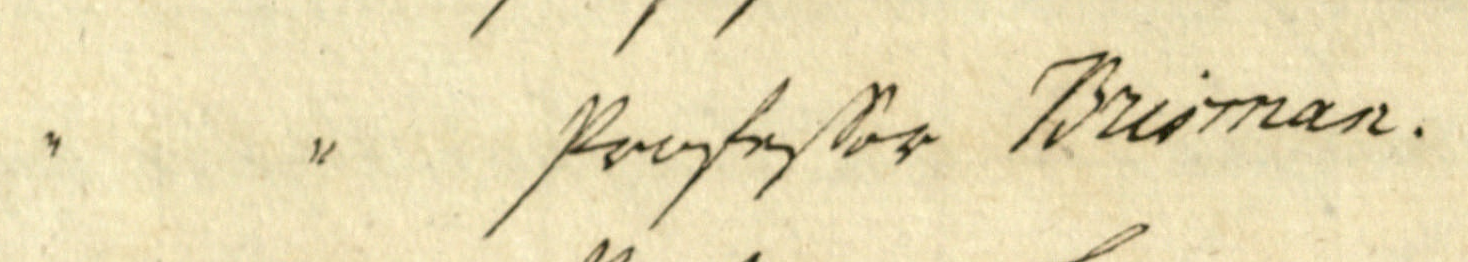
Professor Brisman.
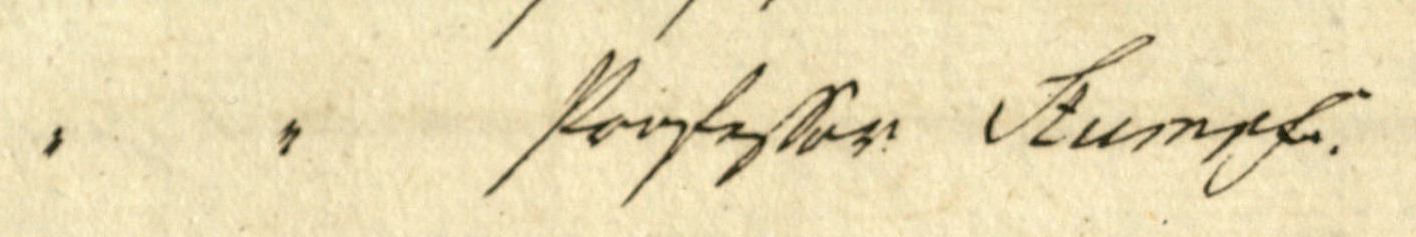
Professor Stumpf.
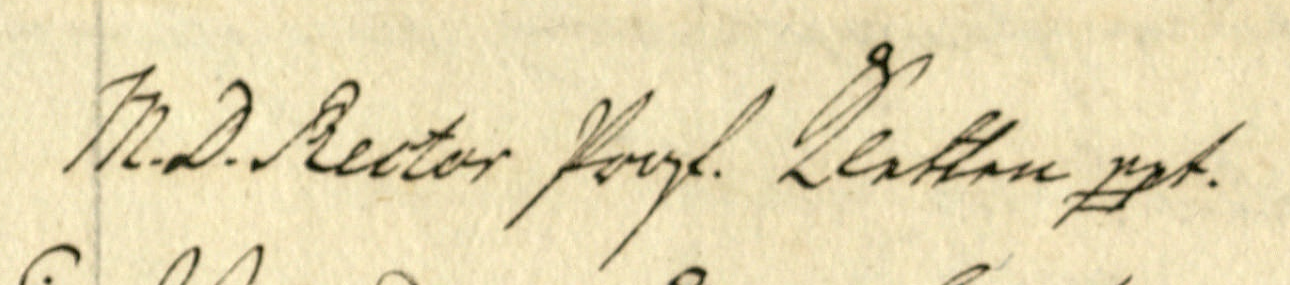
M. D. Rector Prof. Ketten ppt.
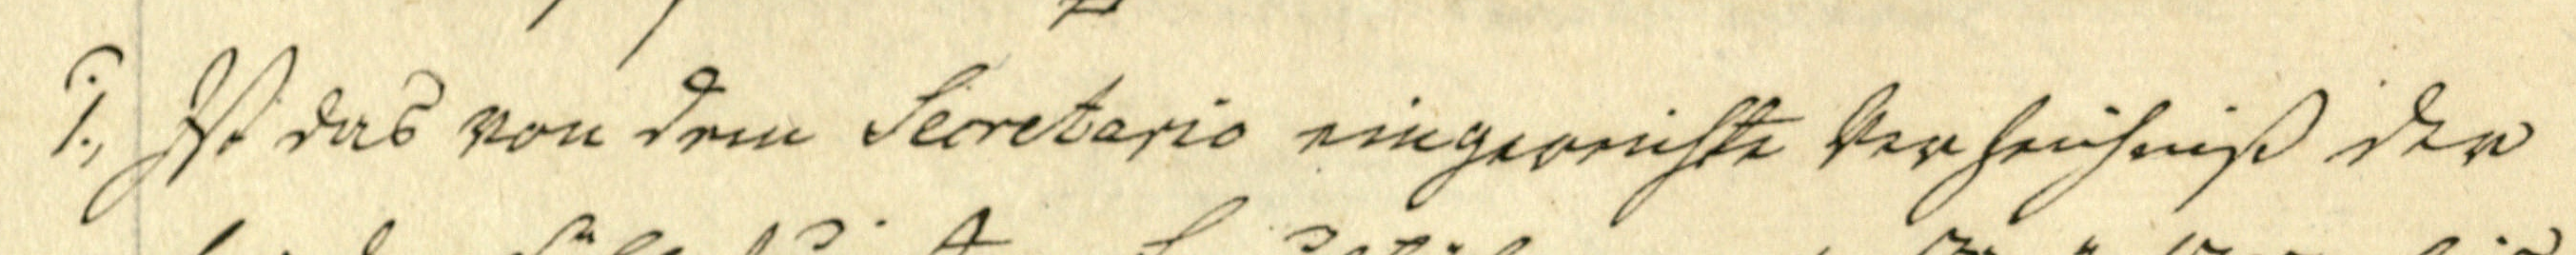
1., Ist das von dem Secretario eingereichte Verzeichniß der
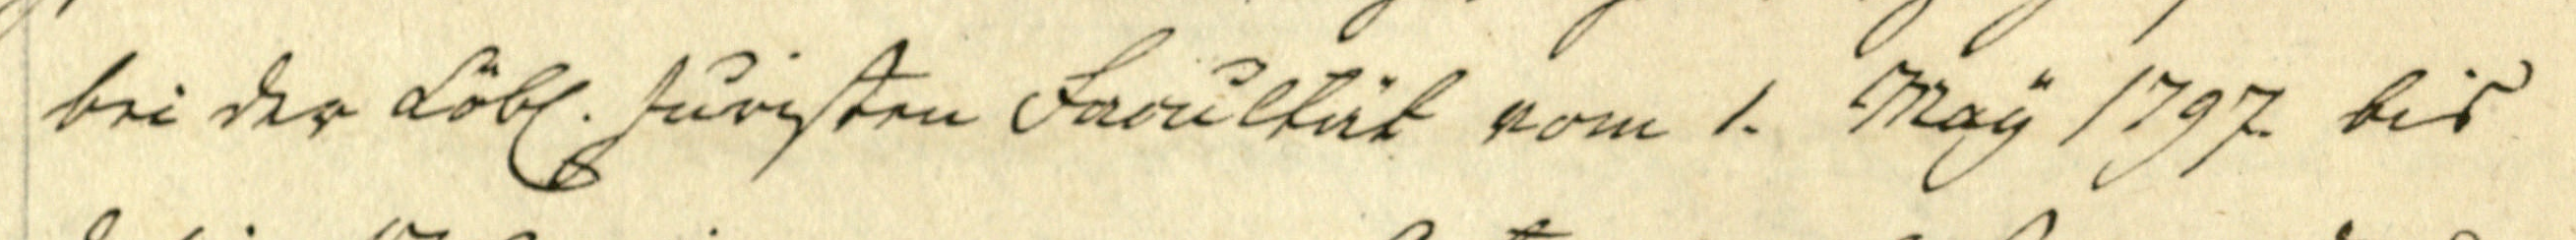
bei der Löbl. Juristen Facultät vom 1. Maÿ 1797. bis
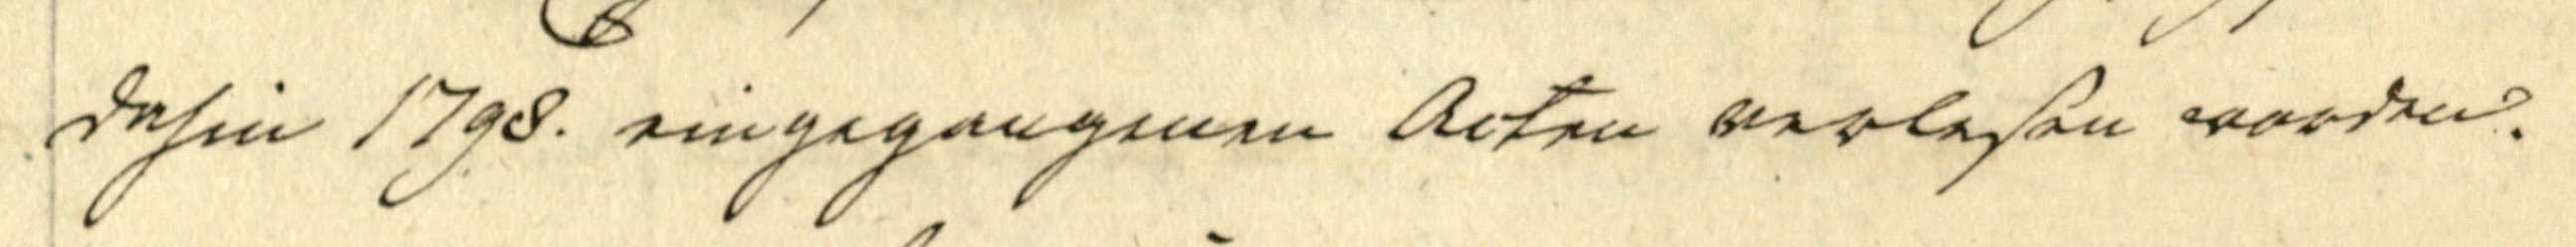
dahin 1798. eingegangenen Acten verlesen worden.
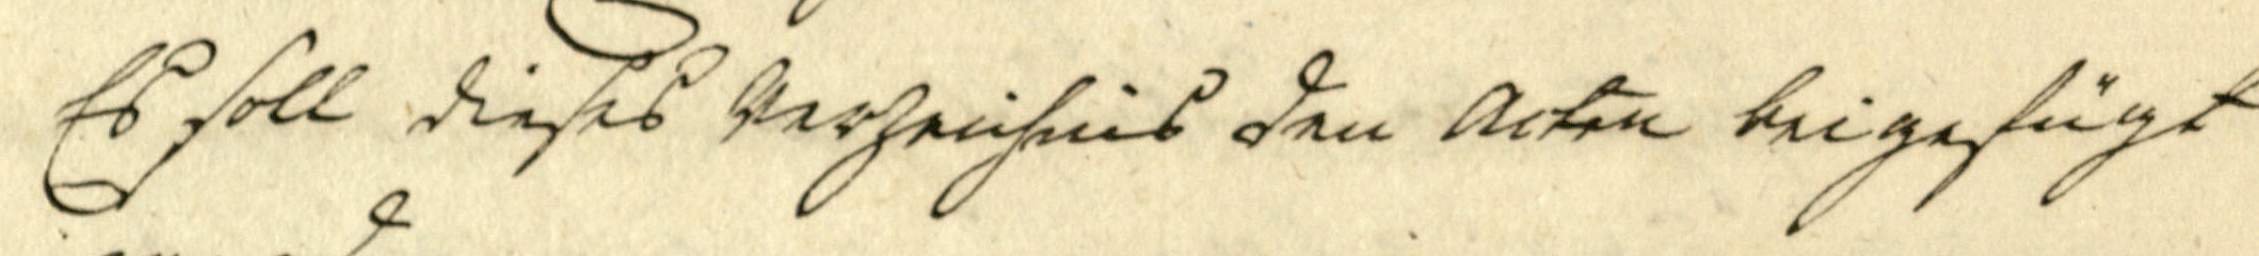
Es soll dieses Verzeichnis den Acta beigefügt
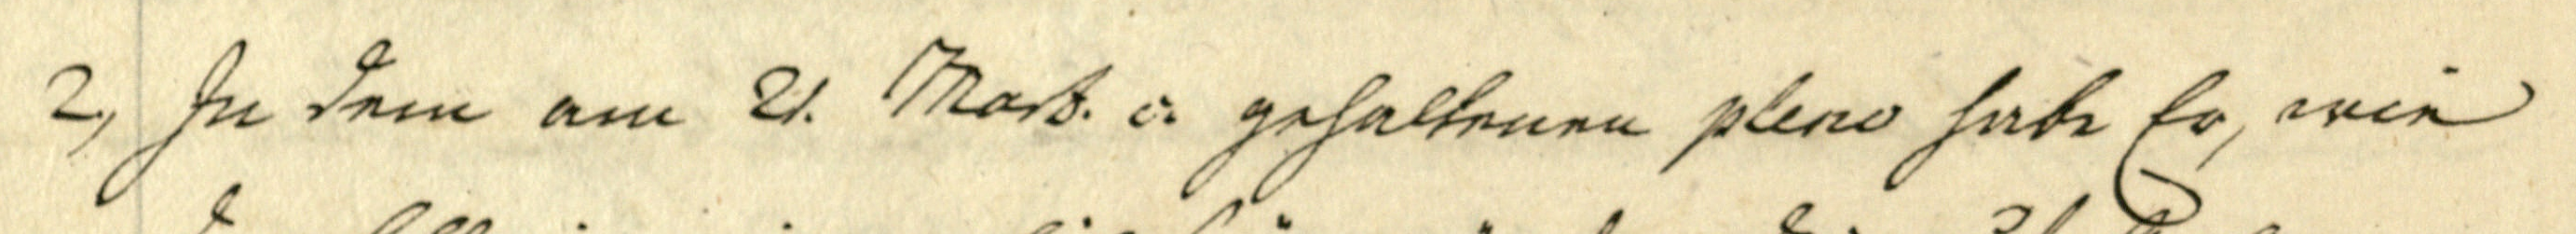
2., In dem am 21. Mart. c. gehaltenen pleno habe Er, wie
